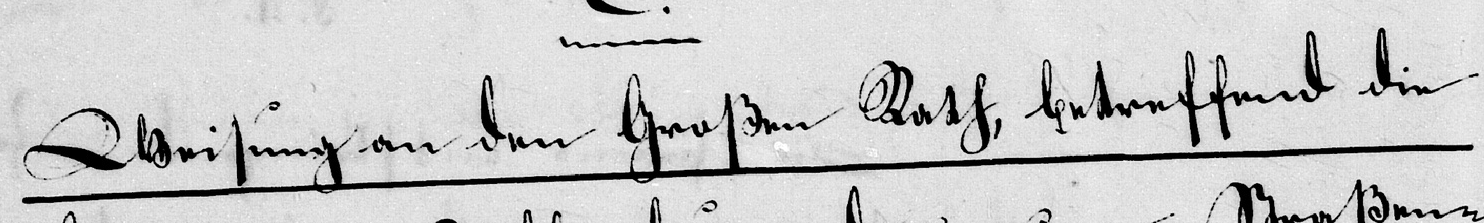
Weisung an den Großen Rath, betreffend die
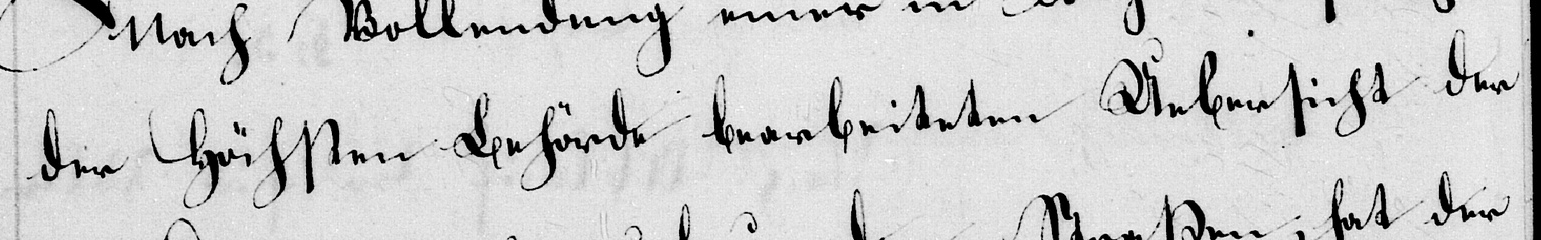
der Höchsten Behörde bearbeiteten Uebersicht der
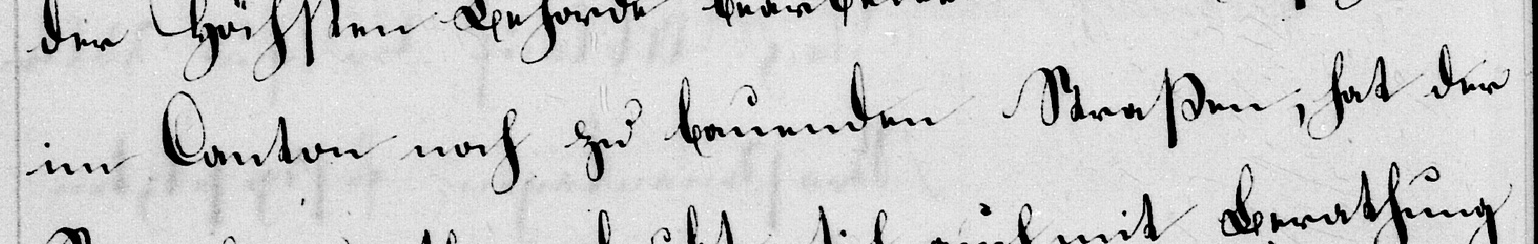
im Canton noch zu bauenden Straßen, hat der
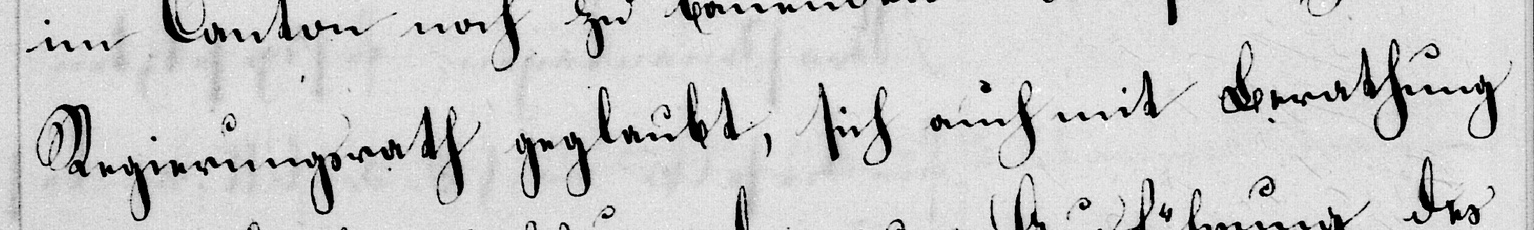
Regierungsrath geglaubt, sich auch mit Berathung
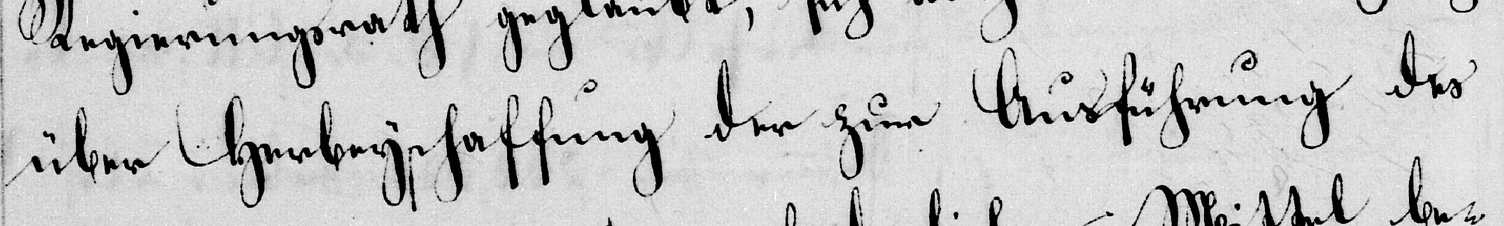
über Herbeyschaffung der zur Ausführung des
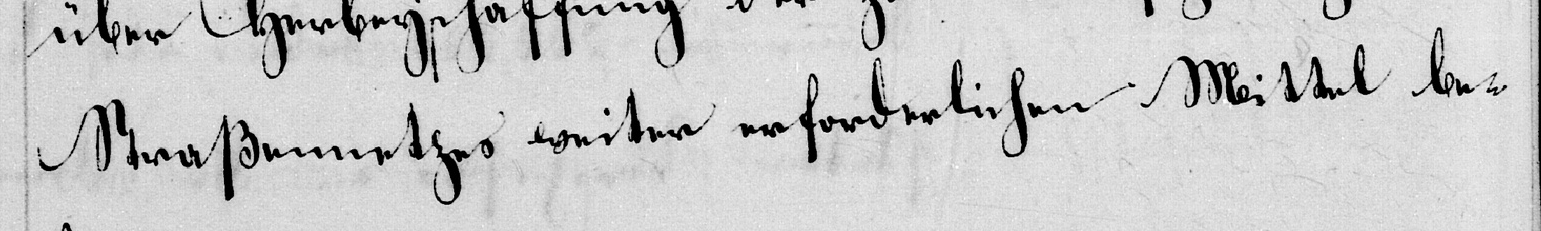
Straßennetzes weiter erforderlichen Mittel be¬
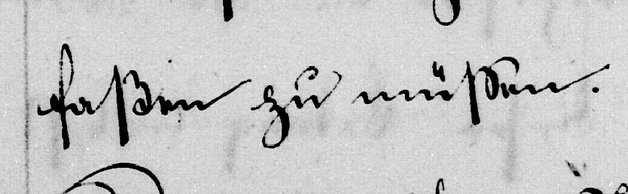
faßen zu müßen.
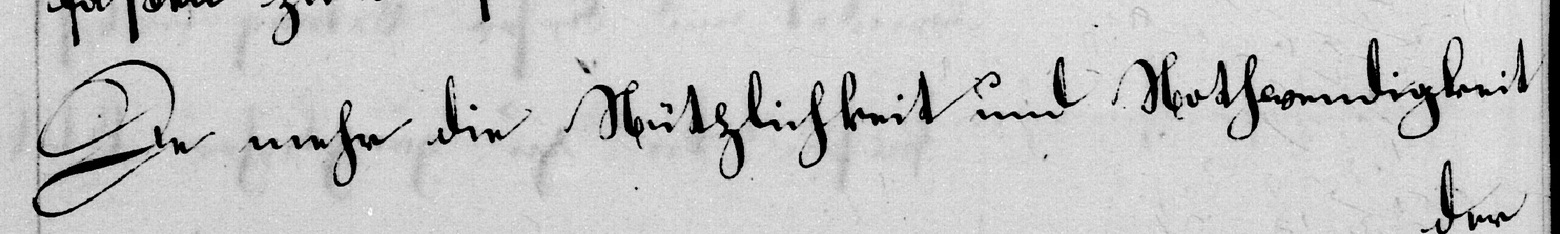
Je mehr die Nützlichkeit und Nothwendigkeit
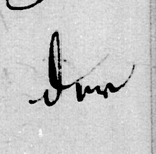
der
